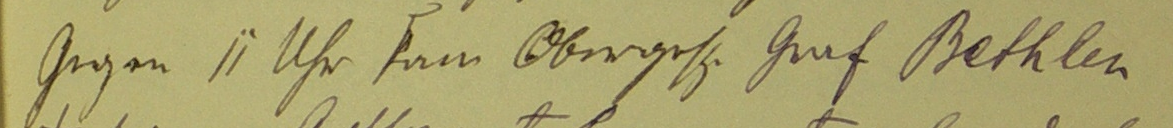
Gegen 11 Uhr kam Obergesp. Graf Bethlen
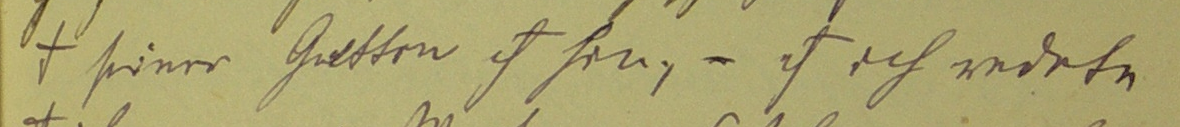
t seiner Gattin h hin; - auch ich redete
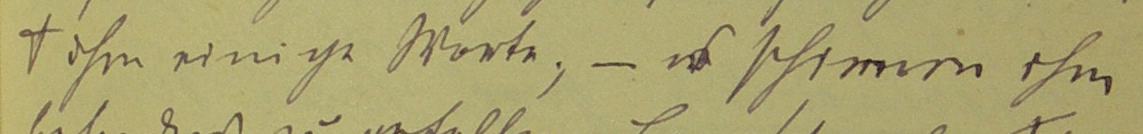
t ihm einige Worte; - Es schienen ihm
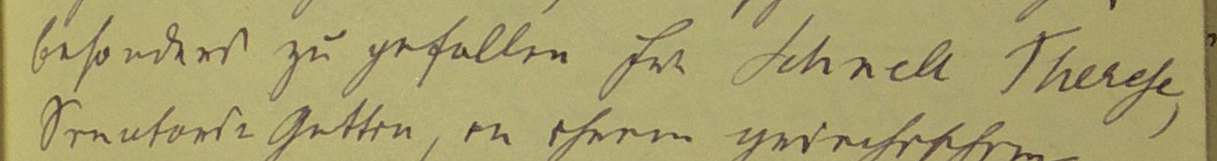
besonders zu gefallen Fr. Schnell Therese,
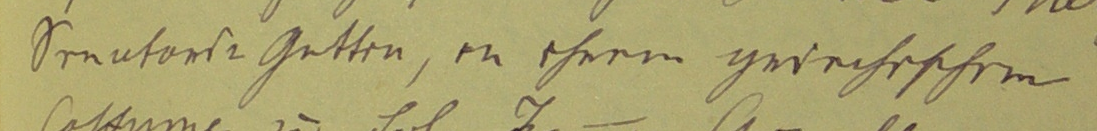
Senators Gattin, in ihrem griechischen
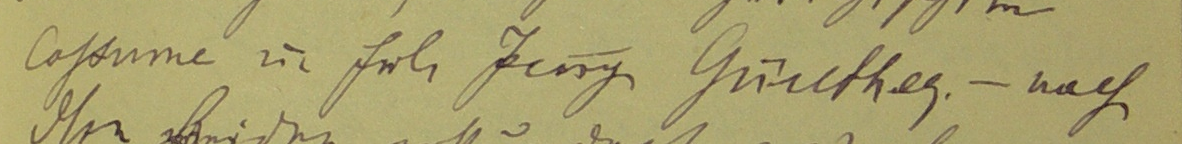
Costum und Frl. Junge Günther. - nach
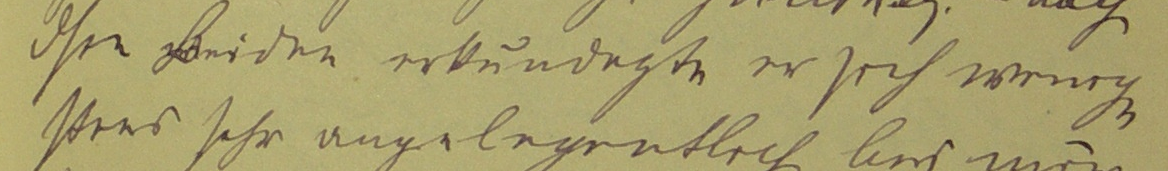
dsen beiden erkundigt er sich wenig¬
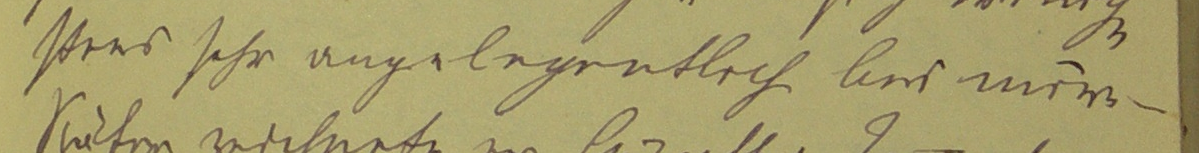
stens sehr angelegentlich bei mir. -
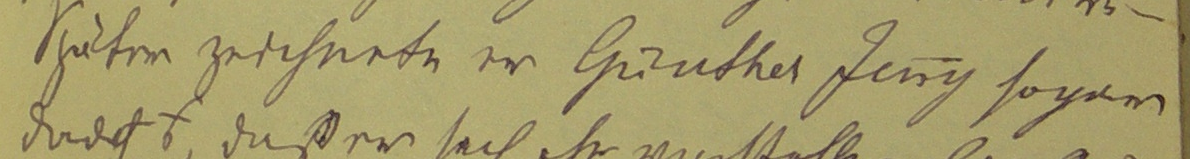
Später zeichnete er Günther Jung sogar
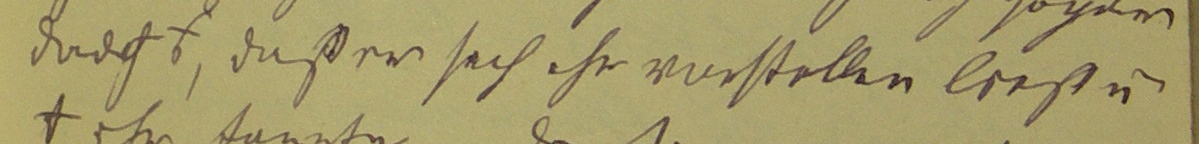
dadurch aus, daß er sich ihr vorstellen ließ und
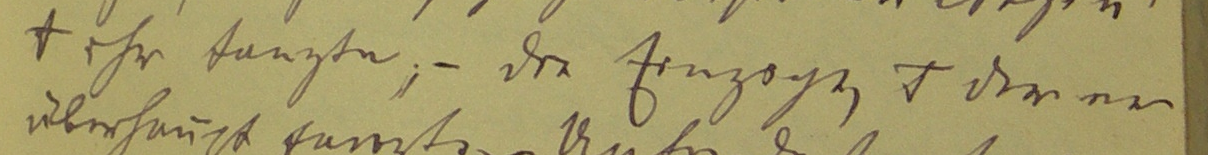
sogar t ihr tanzte; - Die einzige mit der er
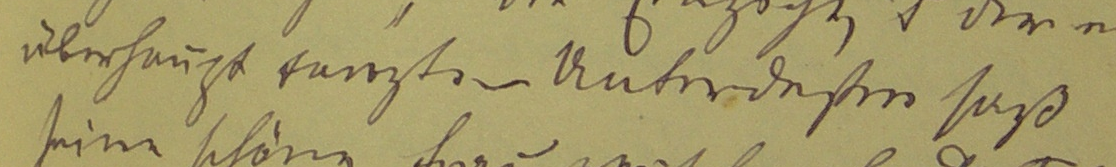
überhaupt tanzte,- unterdessen saß
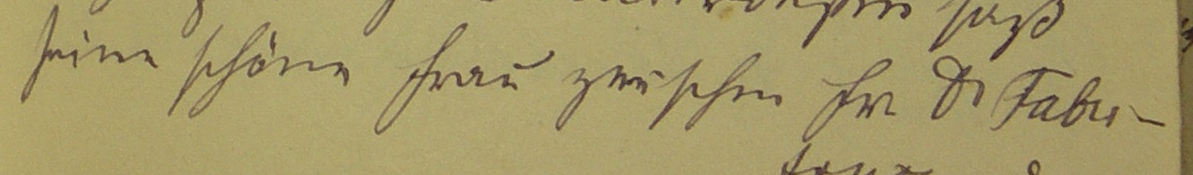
seine schöne Frau zwischen Fr. Dr. Fabri¬
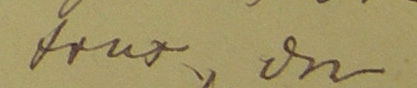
tius, dem
